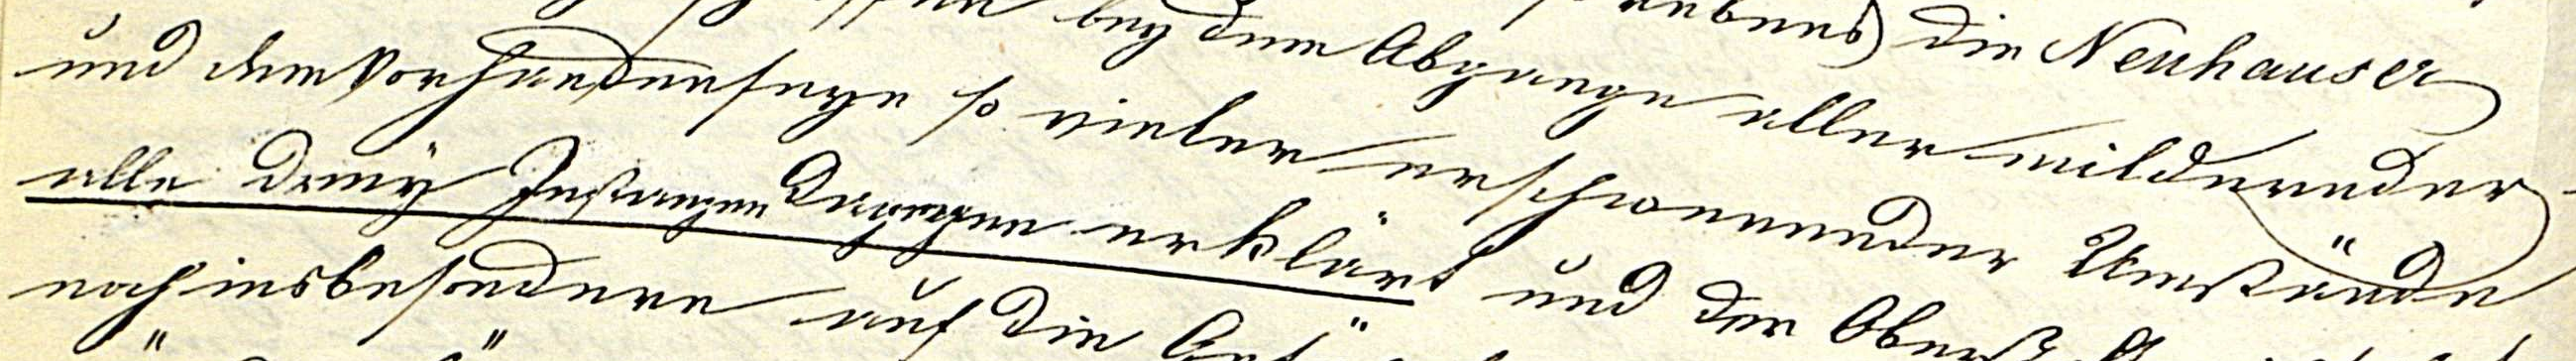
und dem Vorhandenseyn so vieler erschwerender Umstände
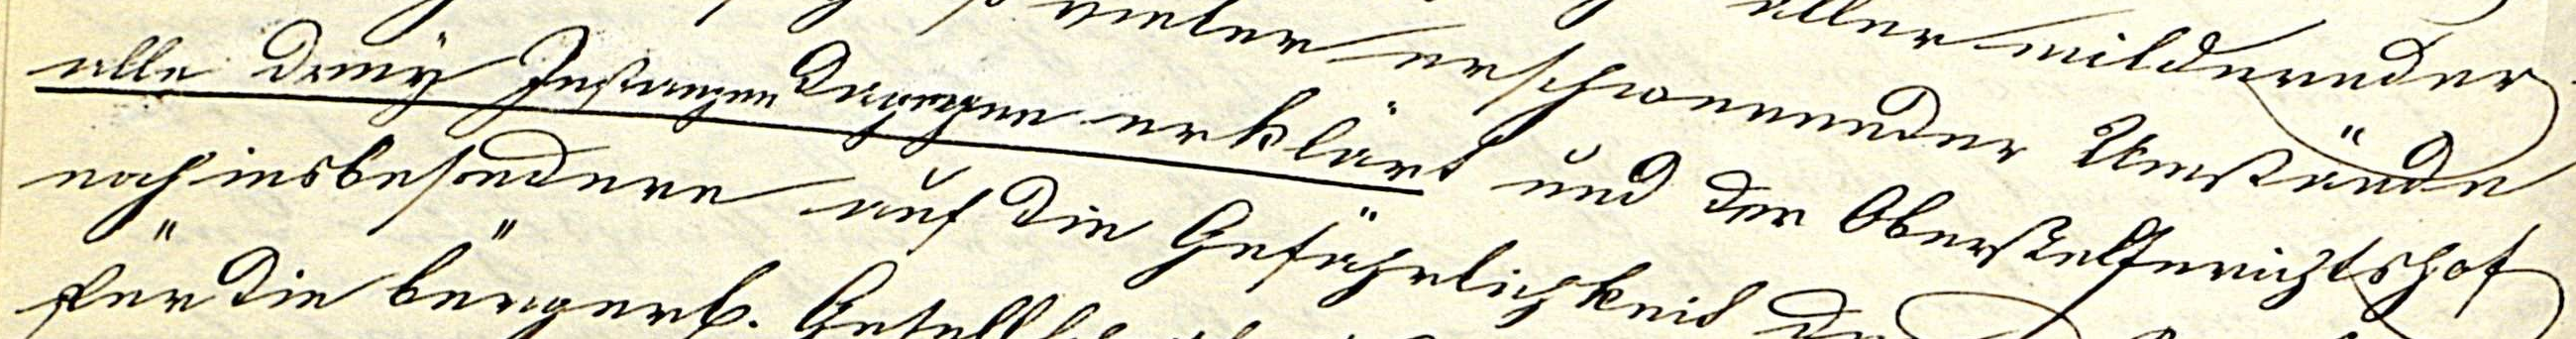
alle drey Instanzen dagegen erklärt und der Oberste Gerichtshof
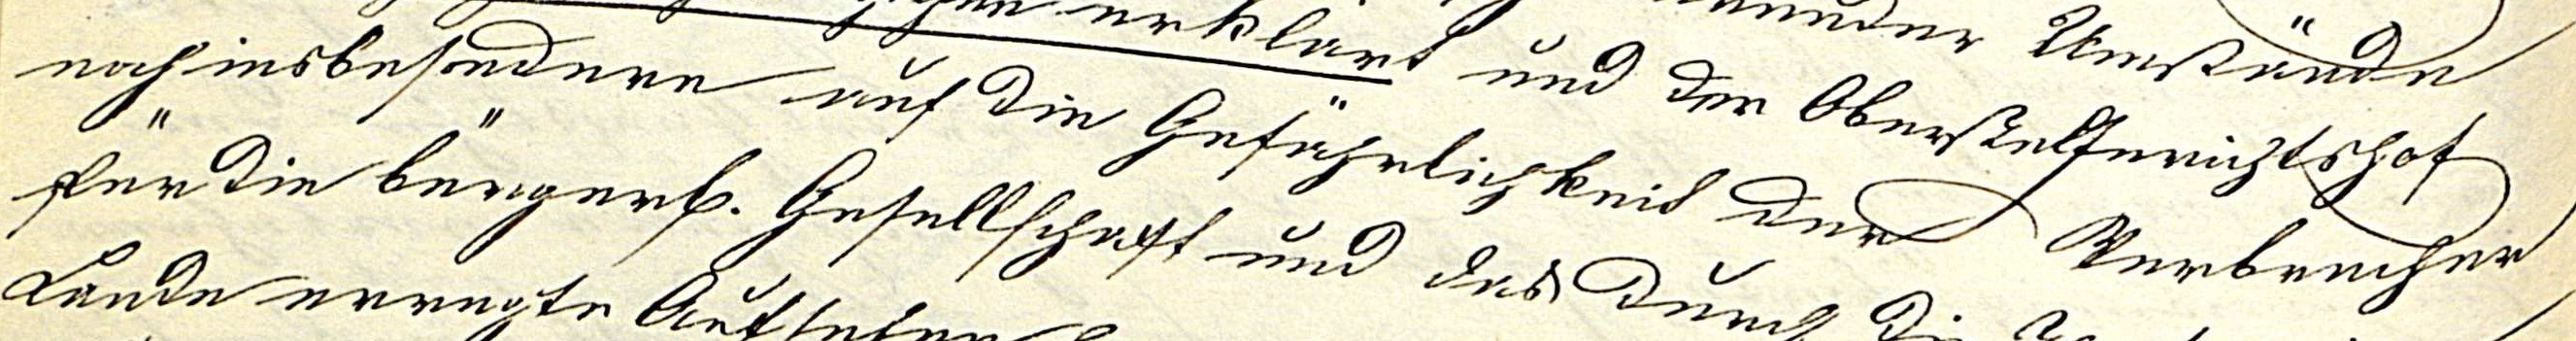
noch ins besondere auf die Gefährlichtkeit der Verbrecher
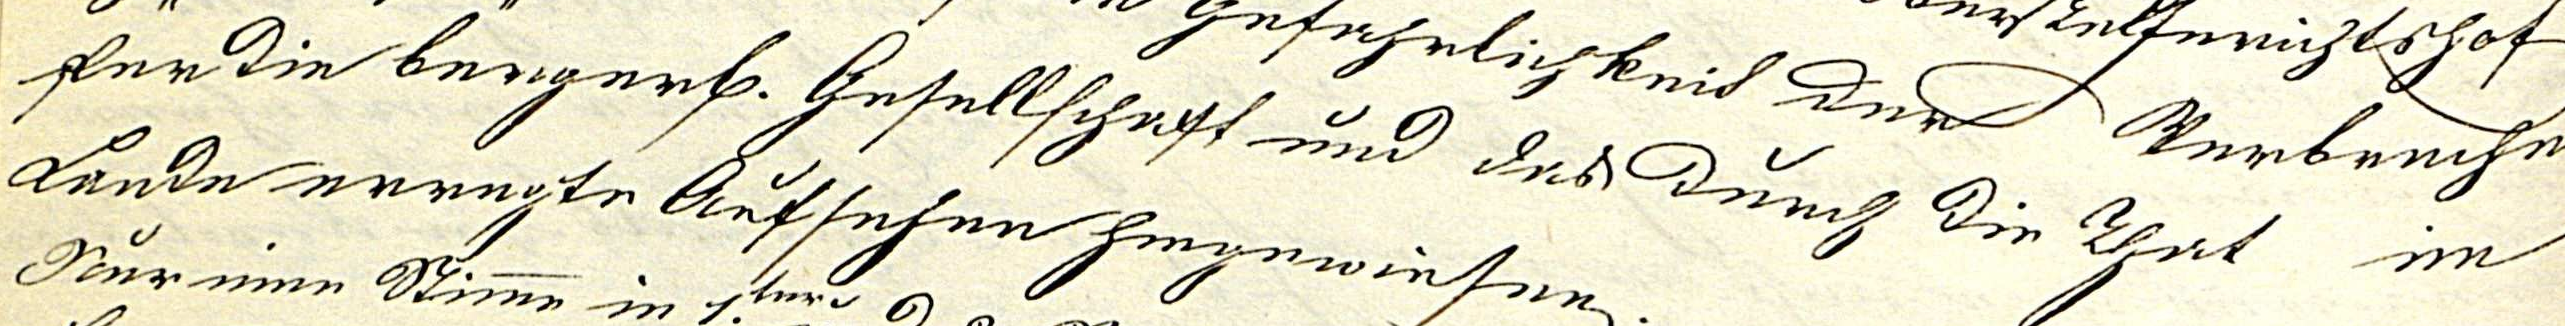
für die bürgerl. Gesellschaft und das durch die That im
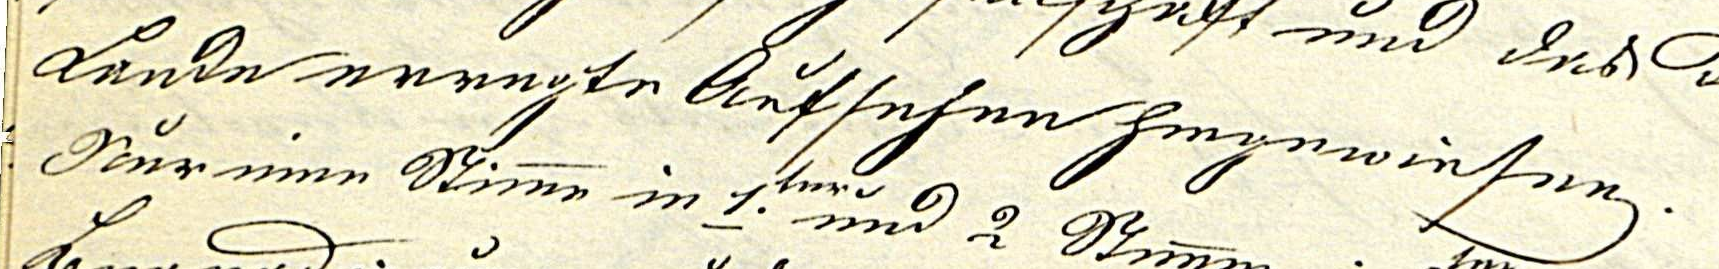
Lande erregte Aufsehen hingewiesen.
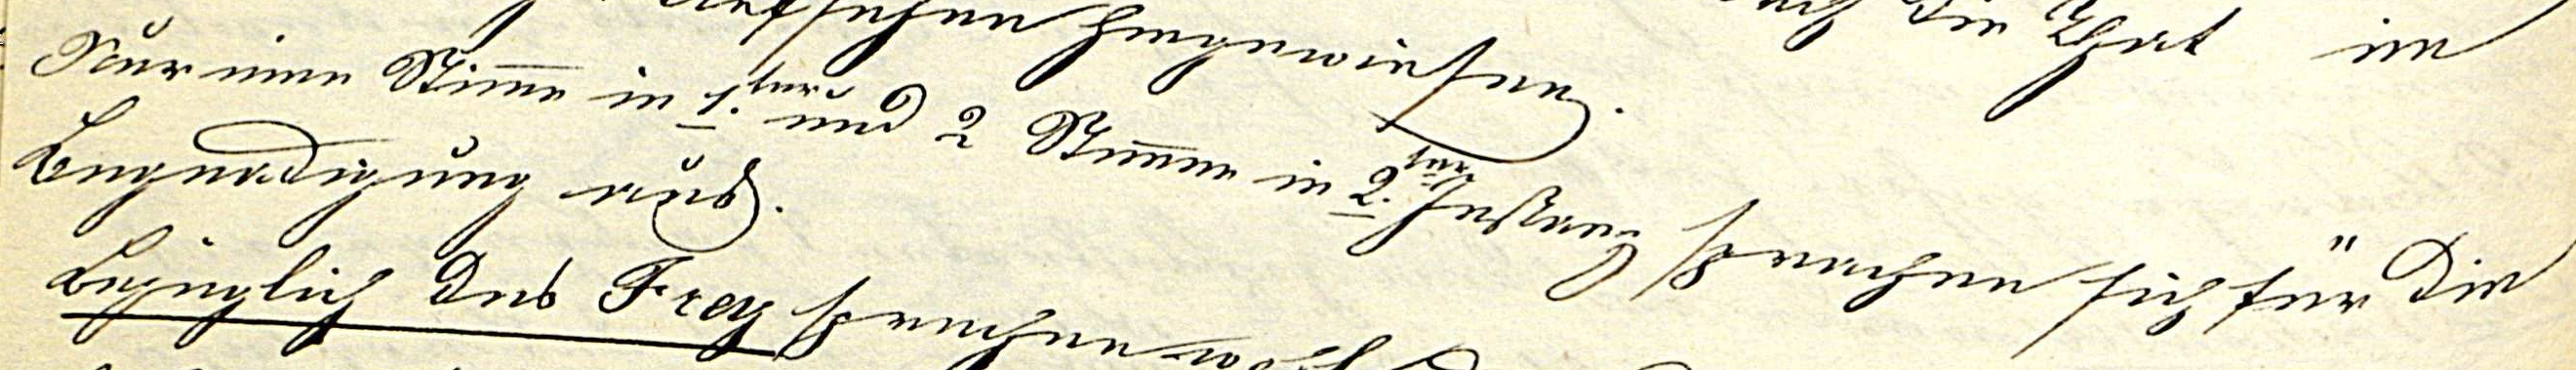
Nur eine Stimme in 1.ter und 2 Stimmen in 2ter Instanz sprachen sich für die
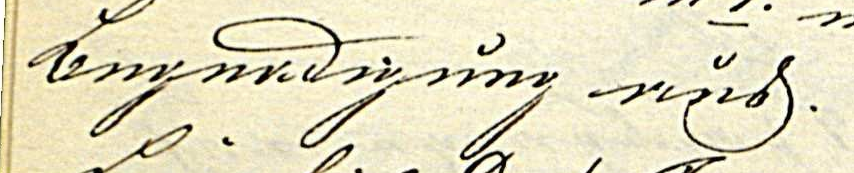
Begnadigung aus.
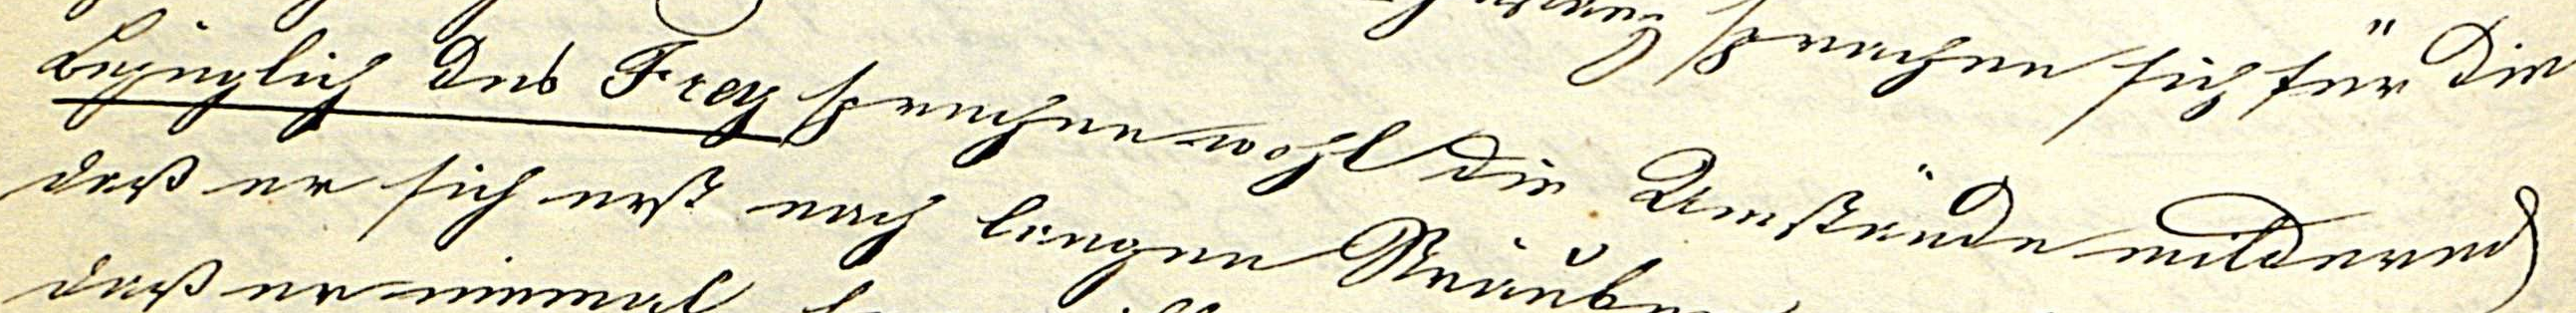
Bezüglich des Frey sprechen wohl die Umstände mildernd:
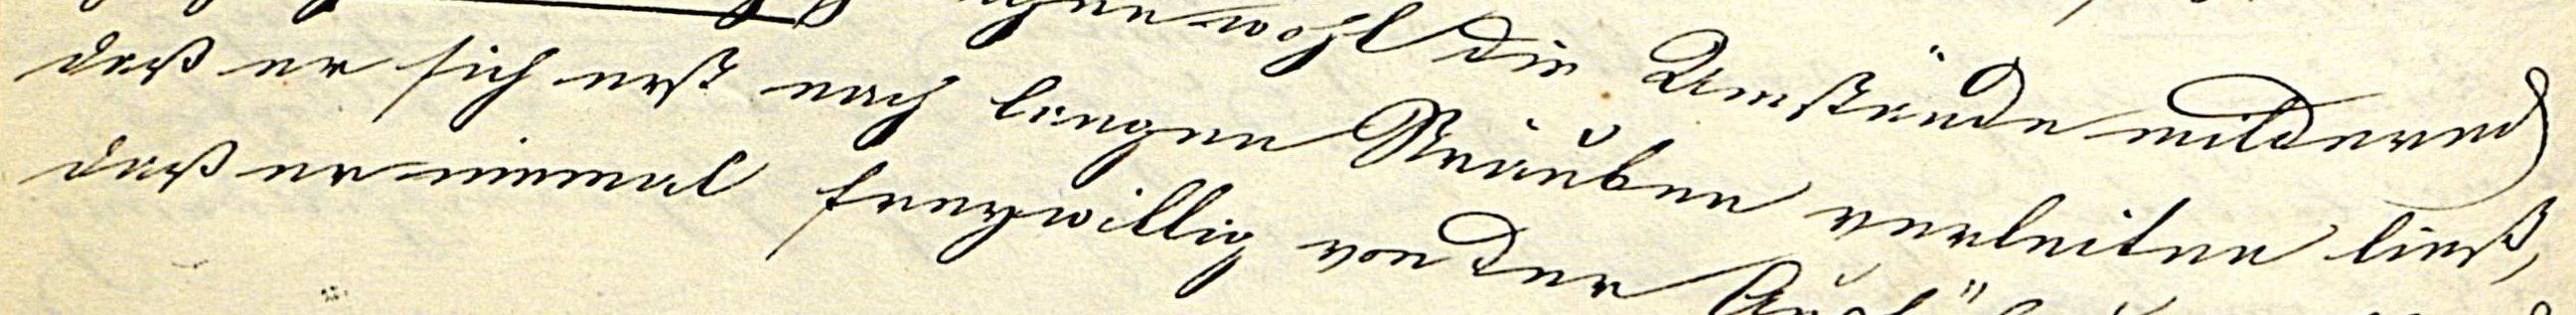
daß er sich erst nach langen Sträuben verleiten ließ,
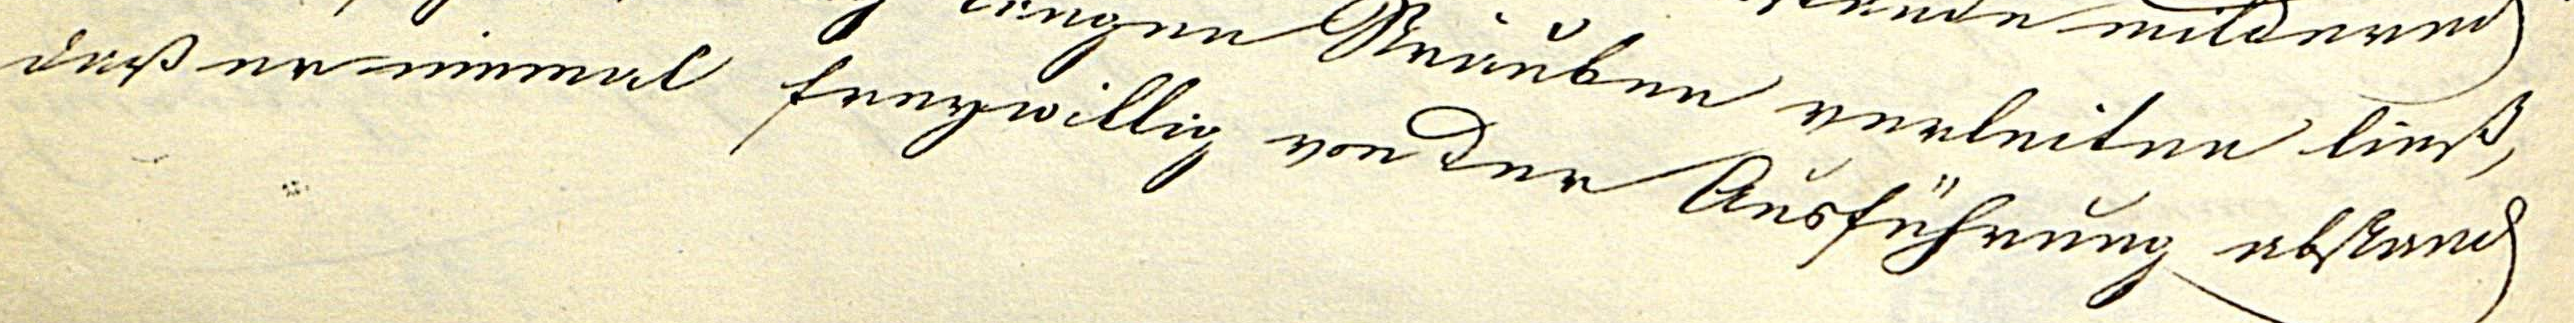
daß er einmal freyeillig von der Ausführung abstand
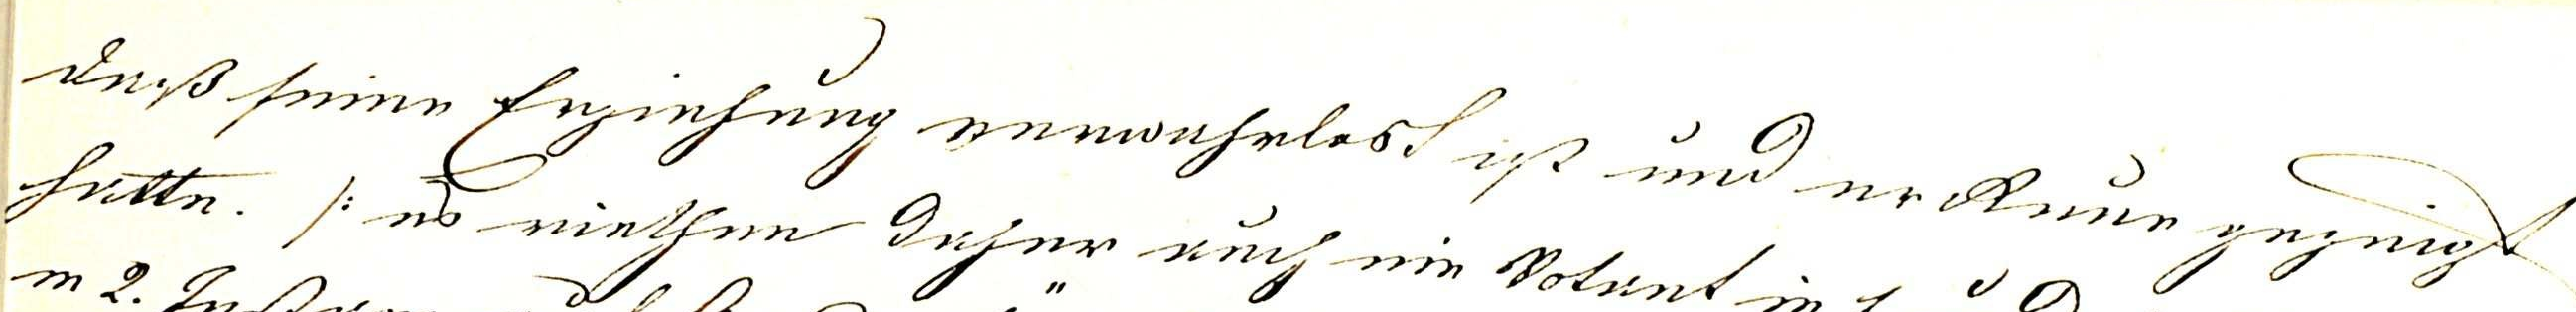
daß seine Erziehung verwahrlost ist und er Reue gezeigt
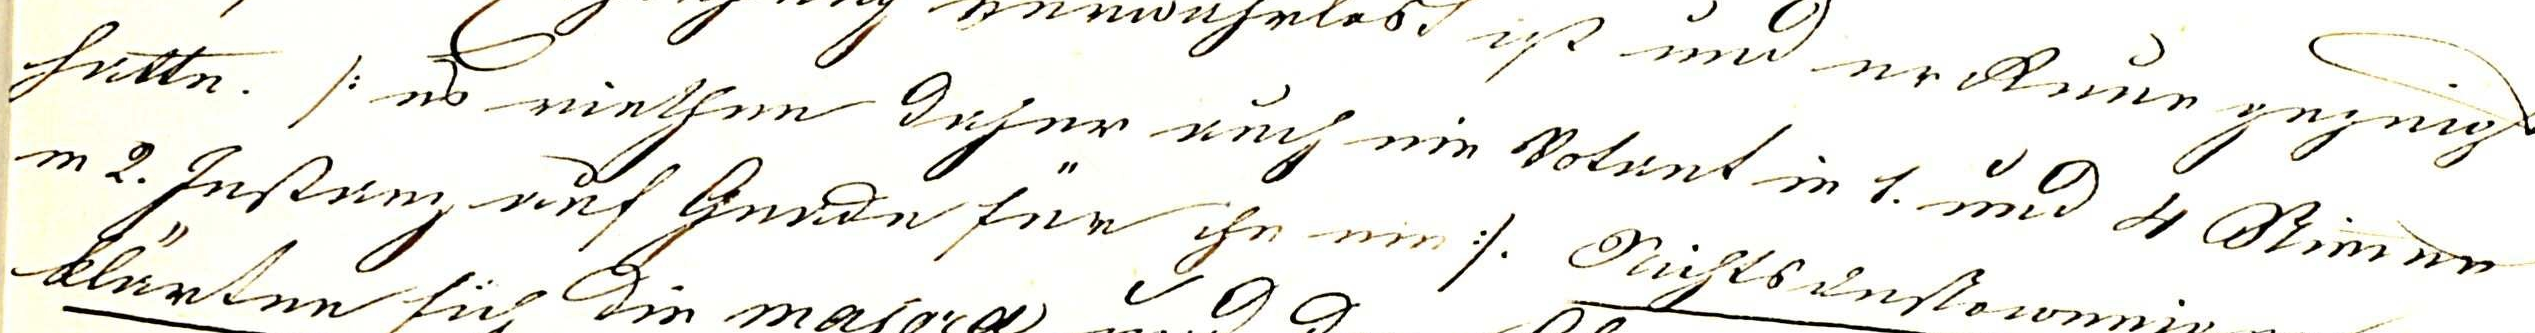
hatte (es riethen daher auch ein Votant in 1. Und 4 Stimmen
